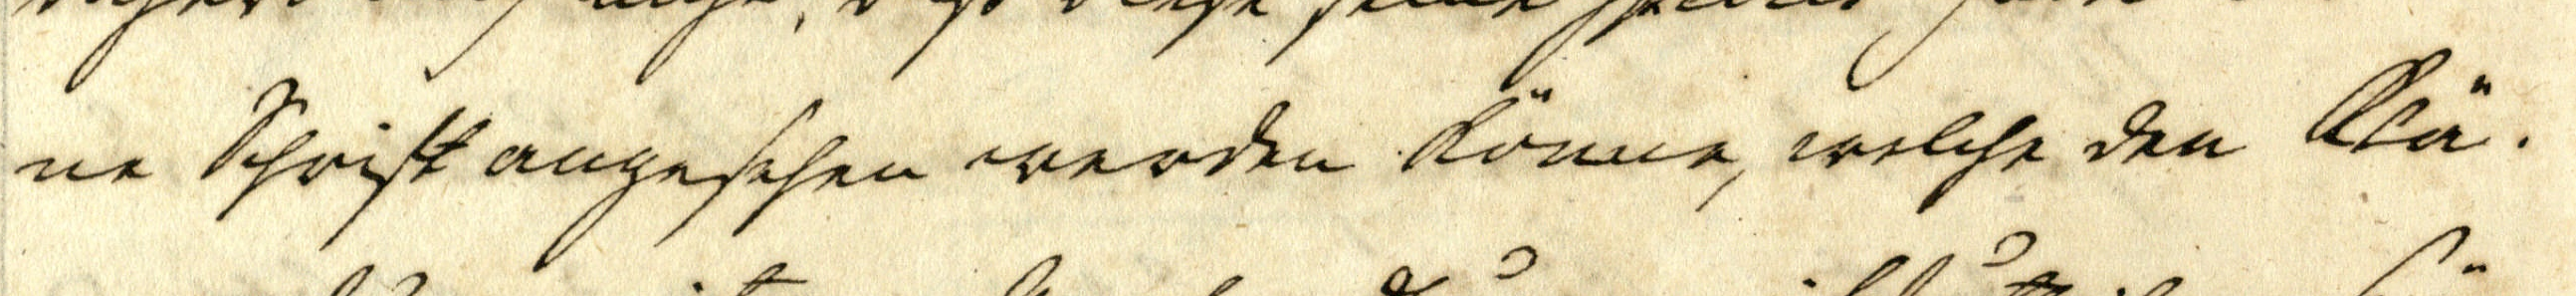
ne Schrift angesehen werden könne, welche den Klä¬
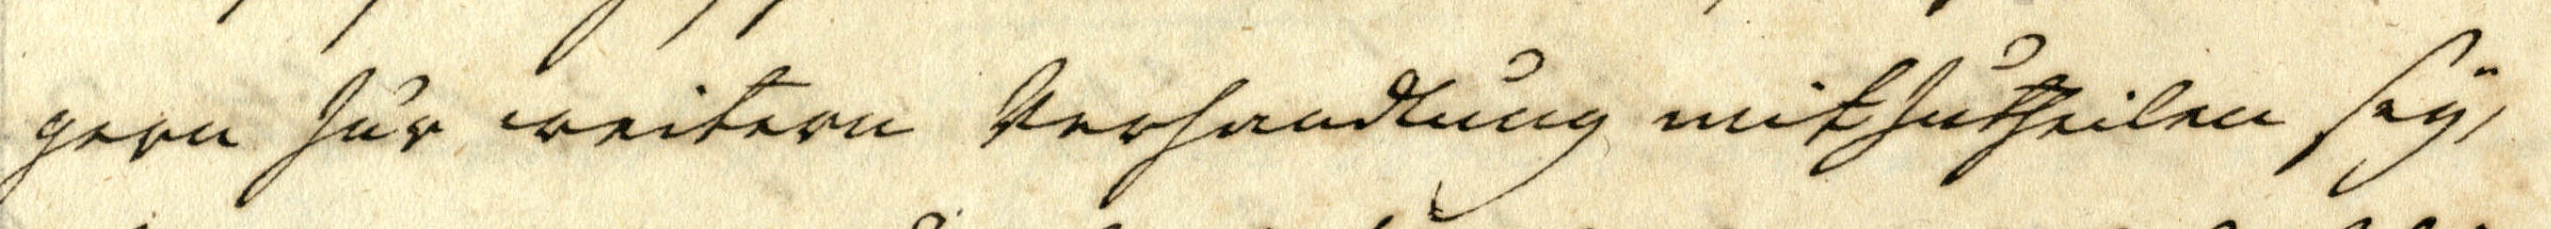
gern zur weitern Verhandlung mit zutheilen seÿ,
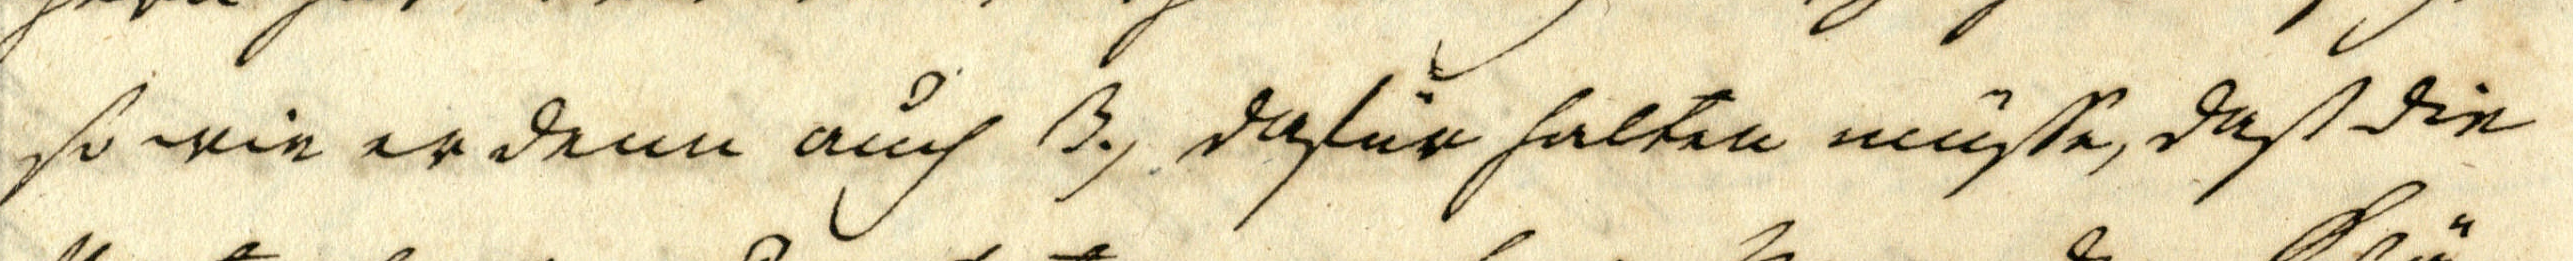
so wie er denn auch 3., dafür halten müsse, daß die
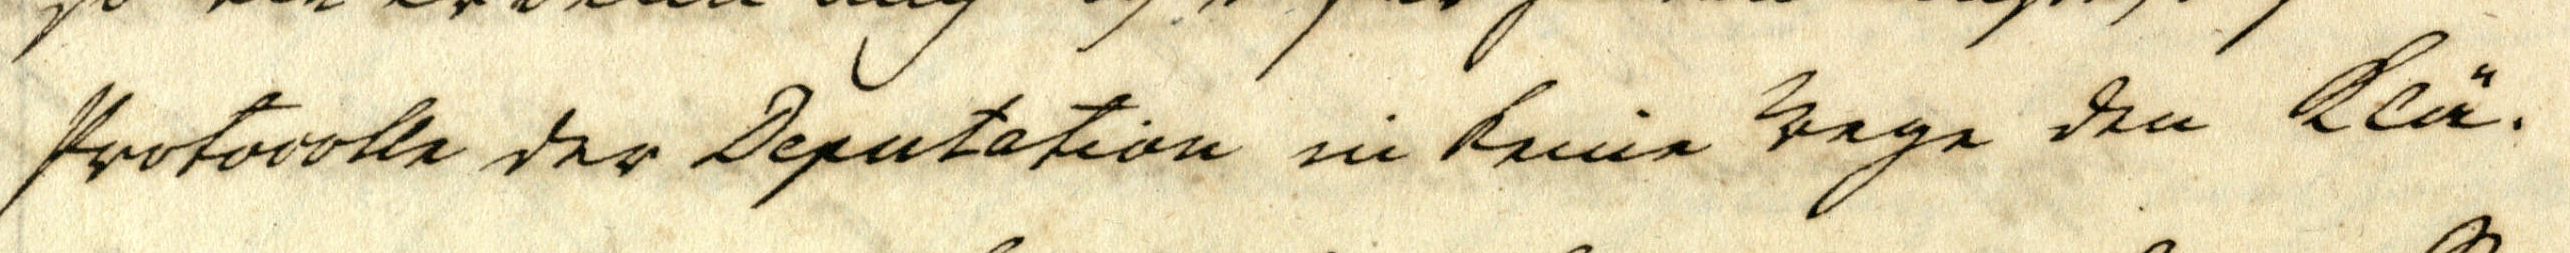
Protocolle der Deputation in keine Wege den Klä¬
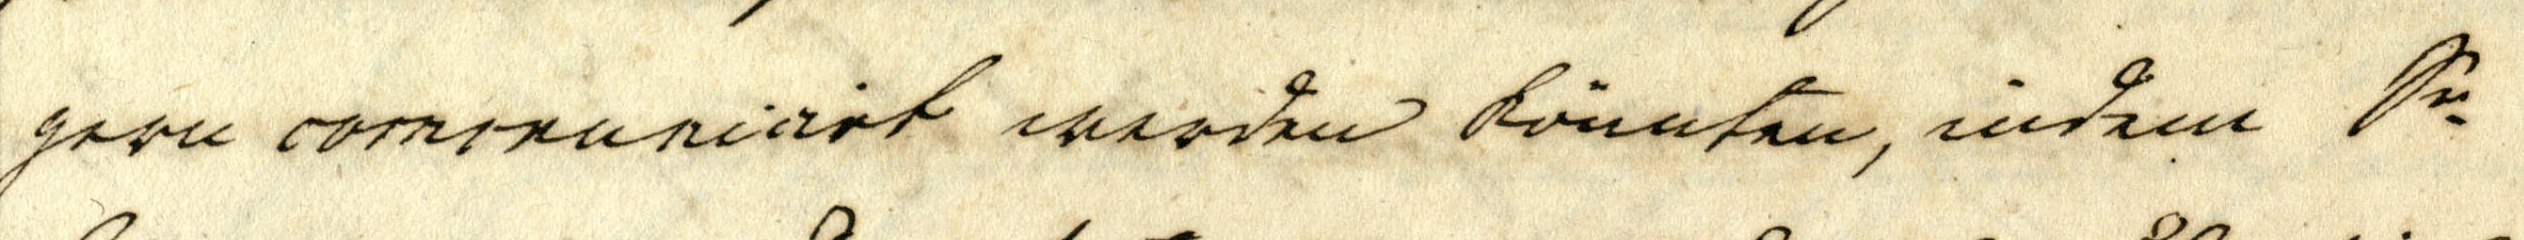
gern communicirt werden könnten, indem Sr
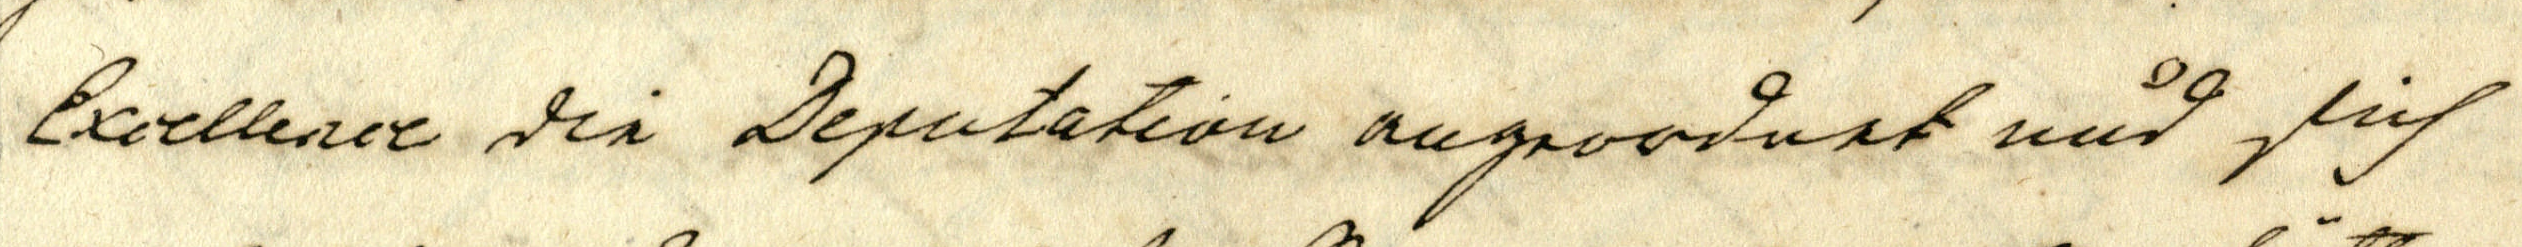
Excellence die Deputation angeordnet und sich
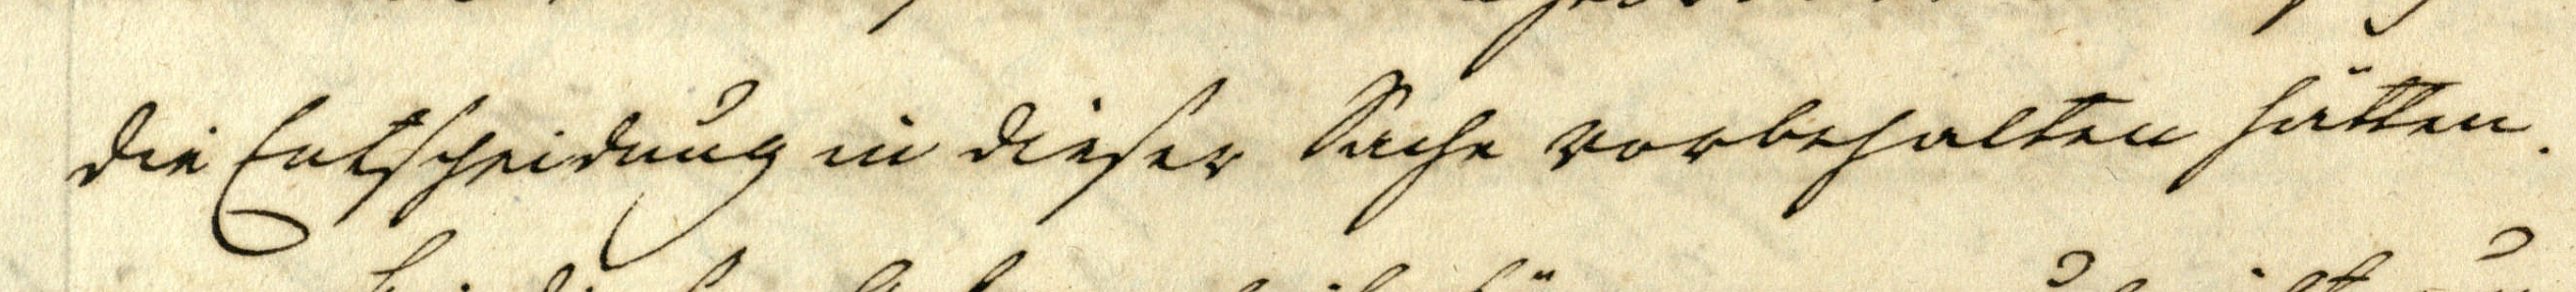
die Entscheidung in dieser Sache vorbehalten hätten.
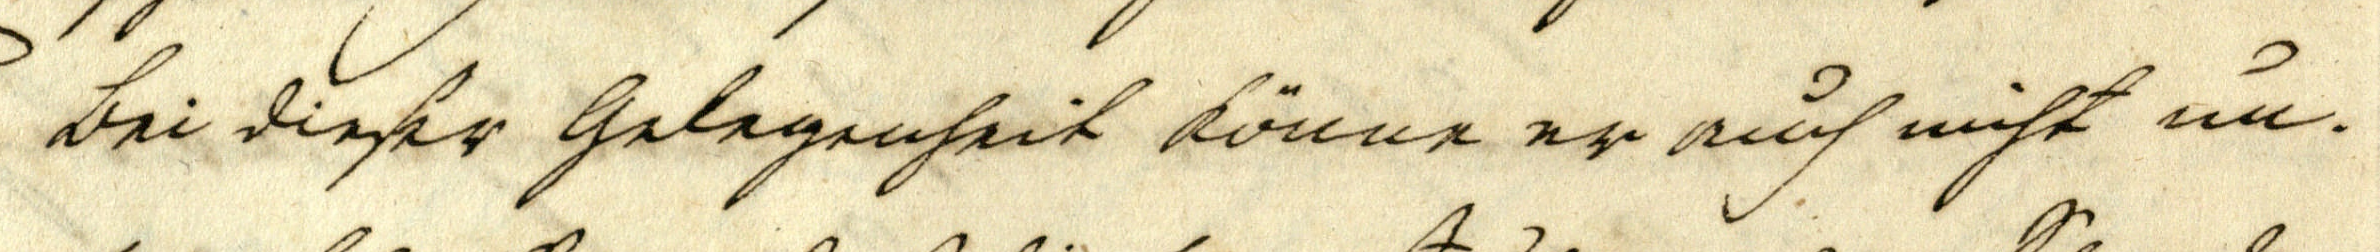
Bei dieser Gelegenheit könne er auch nicht un¬
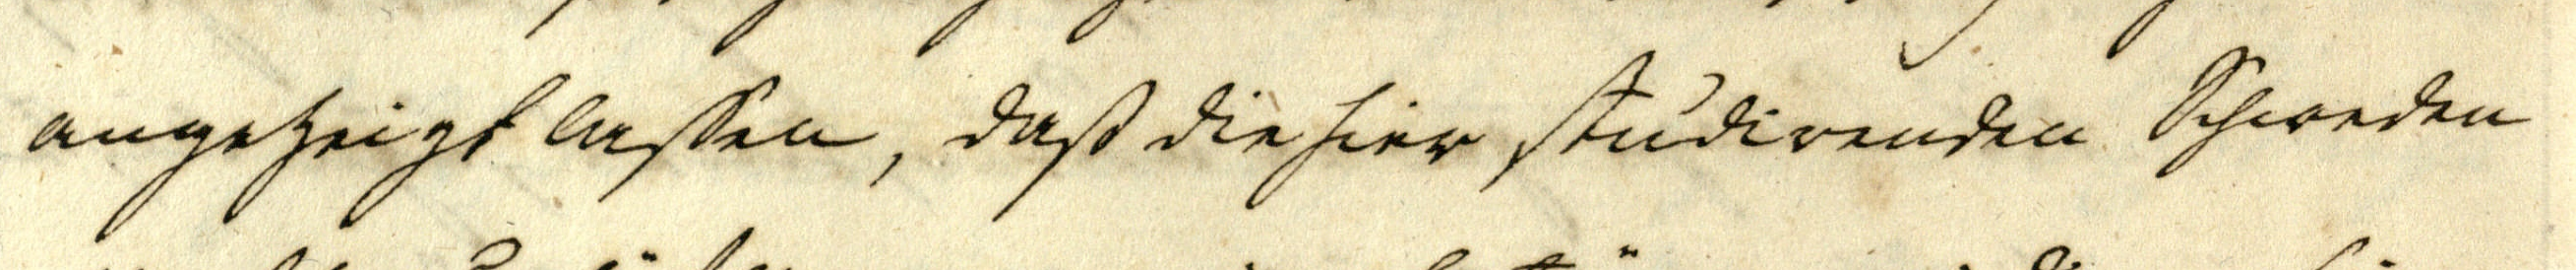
angezeigt lassen, daß die hier studirenden Schweden
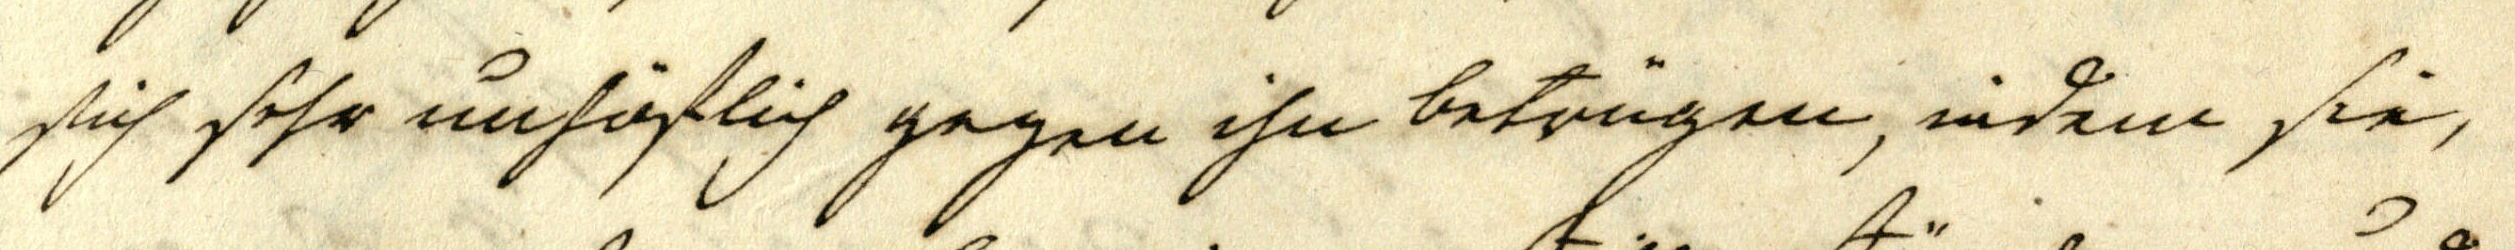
sich sehr unhöflich gegen ihn betrügen, indem sie,
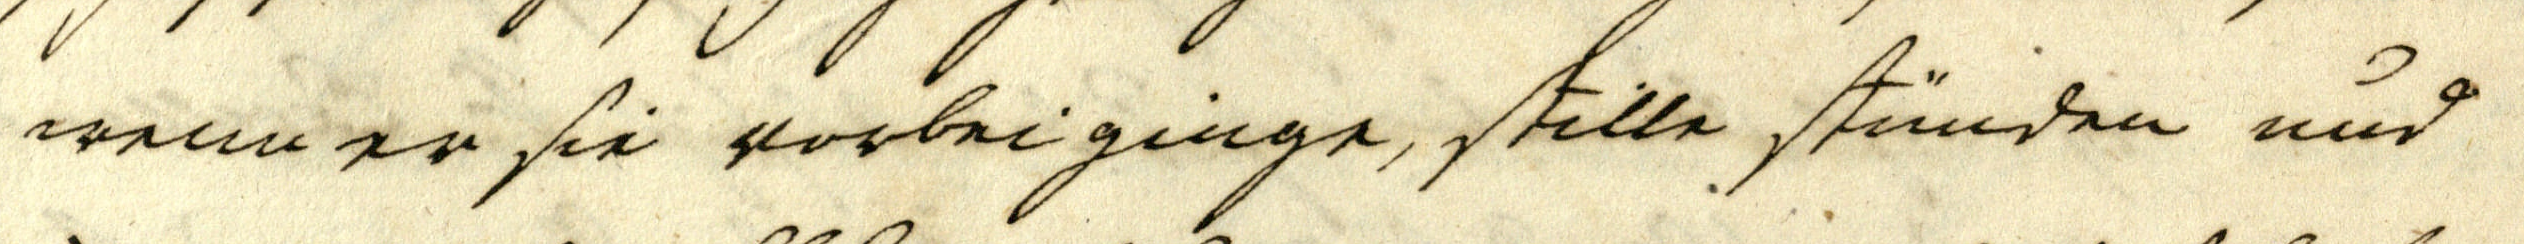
wenn er sie vorbei ginge, stille stünden und
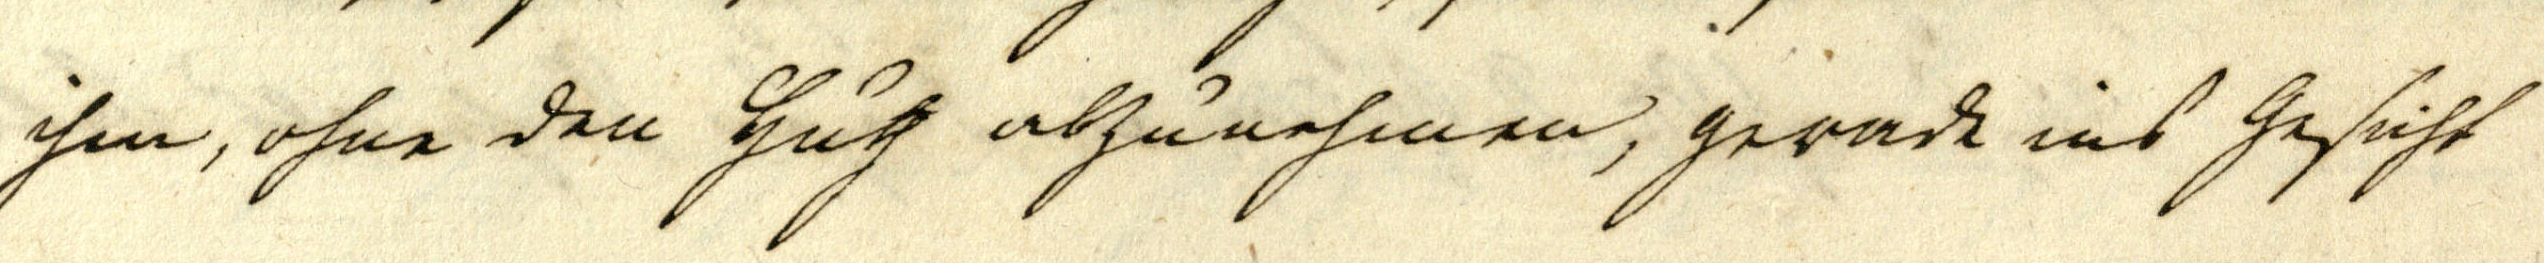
ihm, ohne den Huth abzunehmen, gerade ins Gesicht
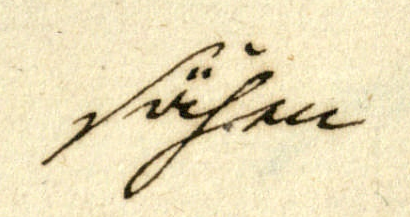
sähen
